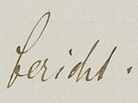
Bericht.
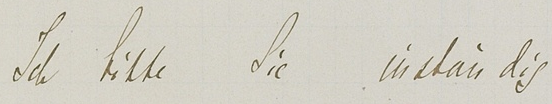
Ich bitte Sie inständig sich
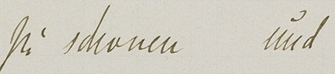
zu schonen und
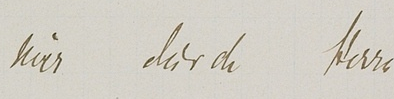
mir durch Herrn
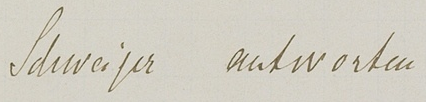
Schweizer antworten
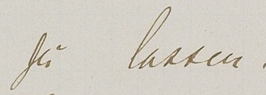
zu lassen.
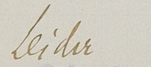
Leider
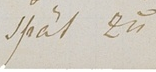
war unsere
